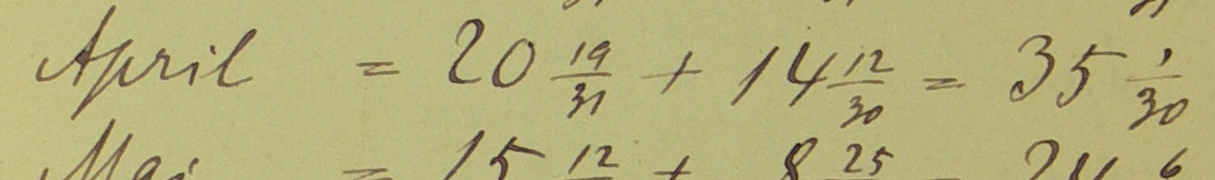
April = 20 19/31 + 14 12/30 = 35 1/30
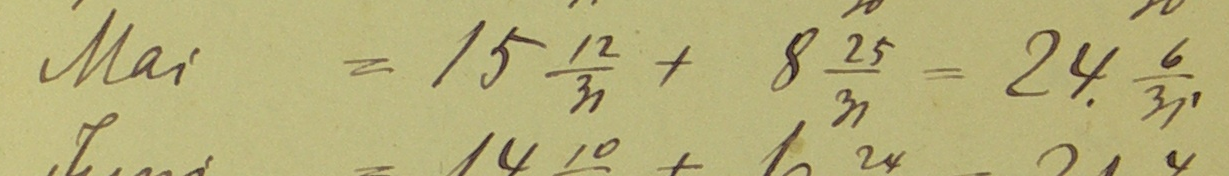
Mai = 15 12/31 + 8 25/31 = 24 6/31
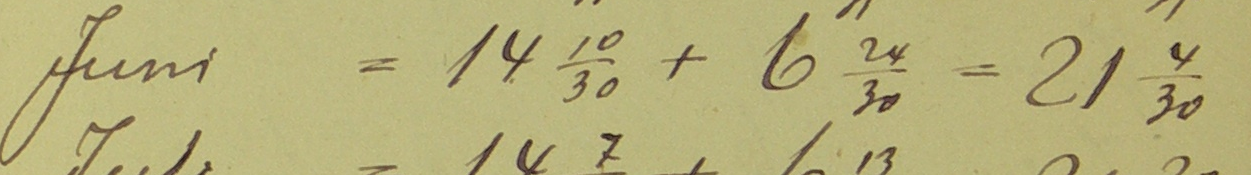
Juni = 14 10/30 + 6 24/30 = 21 4/30
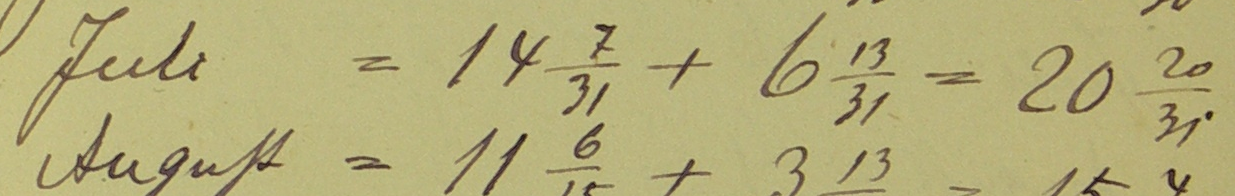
Juli = 14 7/31 + 6 13/31 = 20 20/31
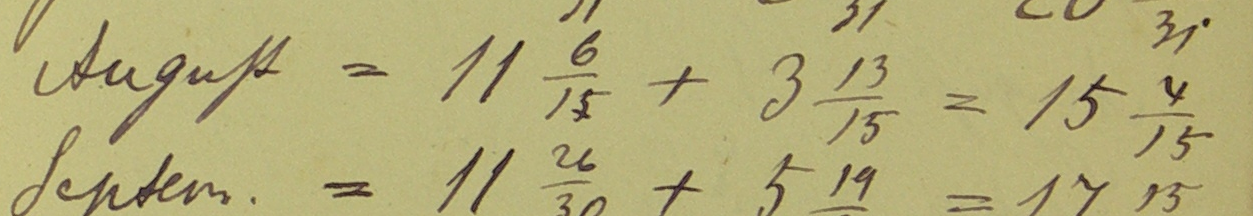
August = 11 6/15 + 3 13/15 = 15 4/15
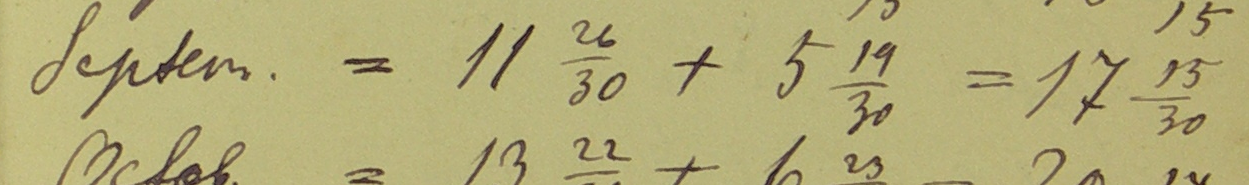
Septem. = 11 26/30 + 5 19/30 = 17 15/30
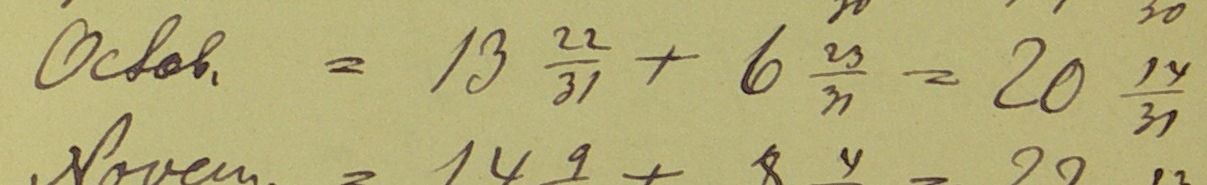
Oktob. = 13 22/31 + 6 23/31 = 20 14/31
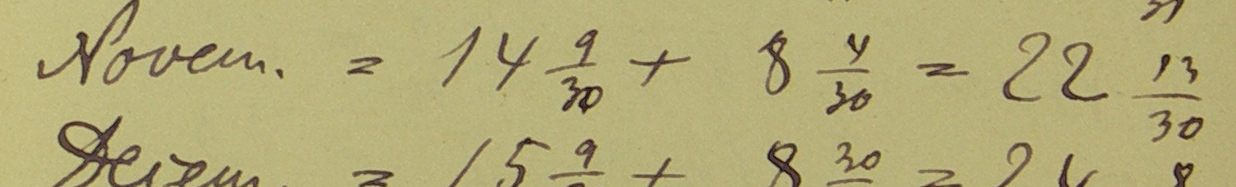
Novem. = 14 9/30 + 8 4/30 = 22 13/30
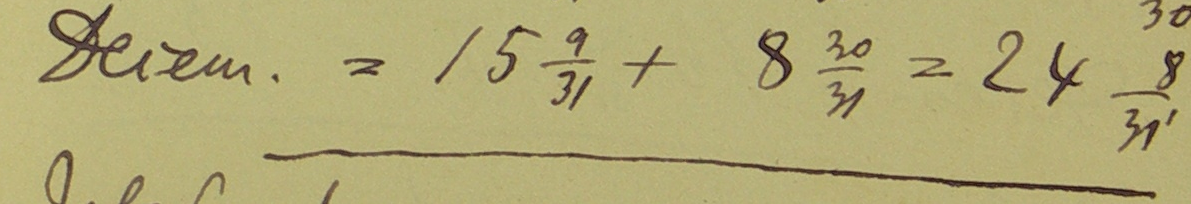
Dezem. = 15 9/31 + 8 30/31 = 24 8/31
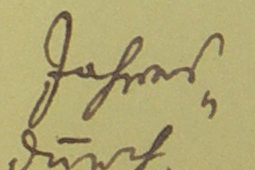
Jahres¬
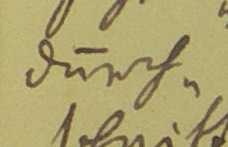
Durch¬
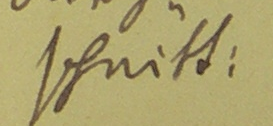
schnitt:
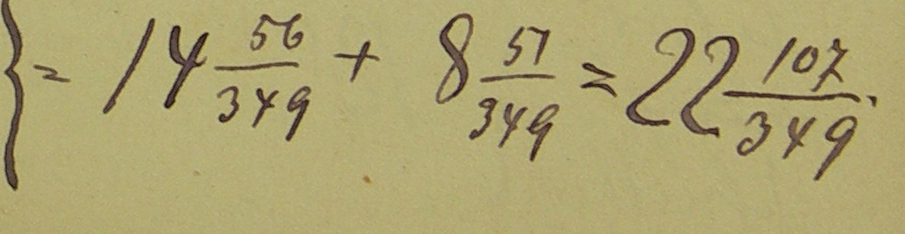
= 14 56/349 + 8 57/349 = 22 107/349
